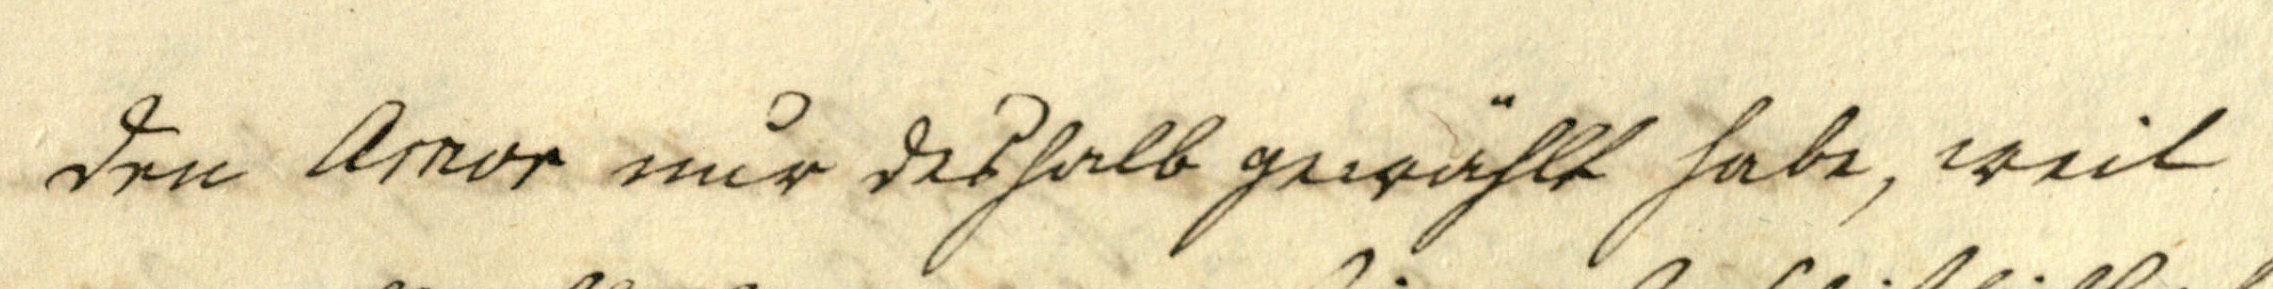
den Amor nur deshalb gewählt habe, weil
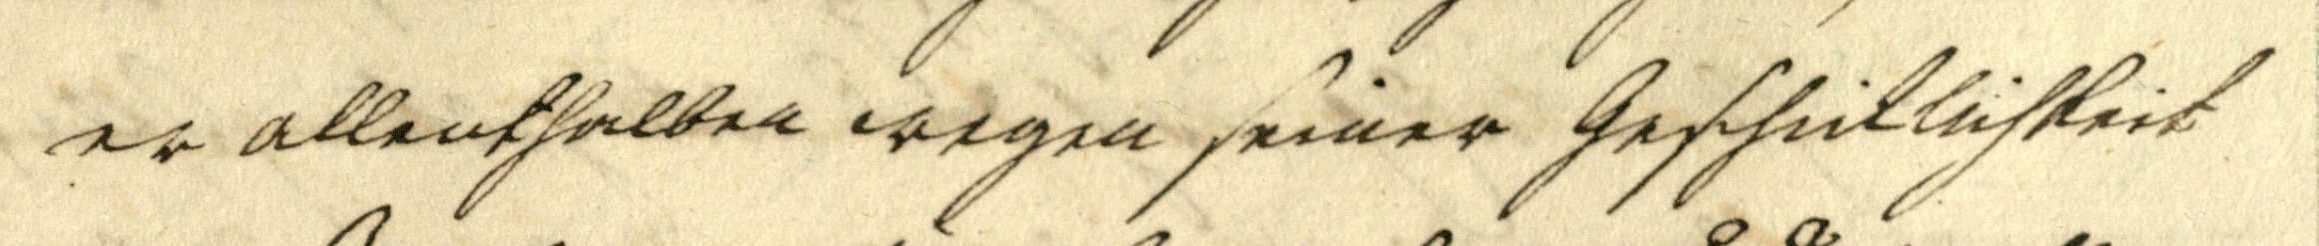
er allenthalben wegen seiner Geschicklichkeit
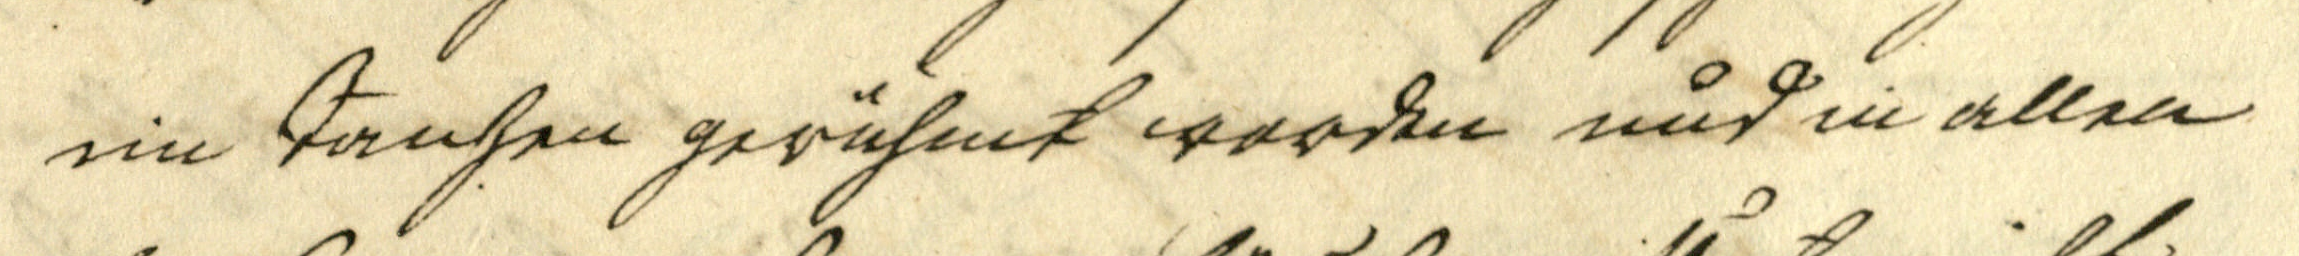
im Tanzen gerühmt worden und in allen
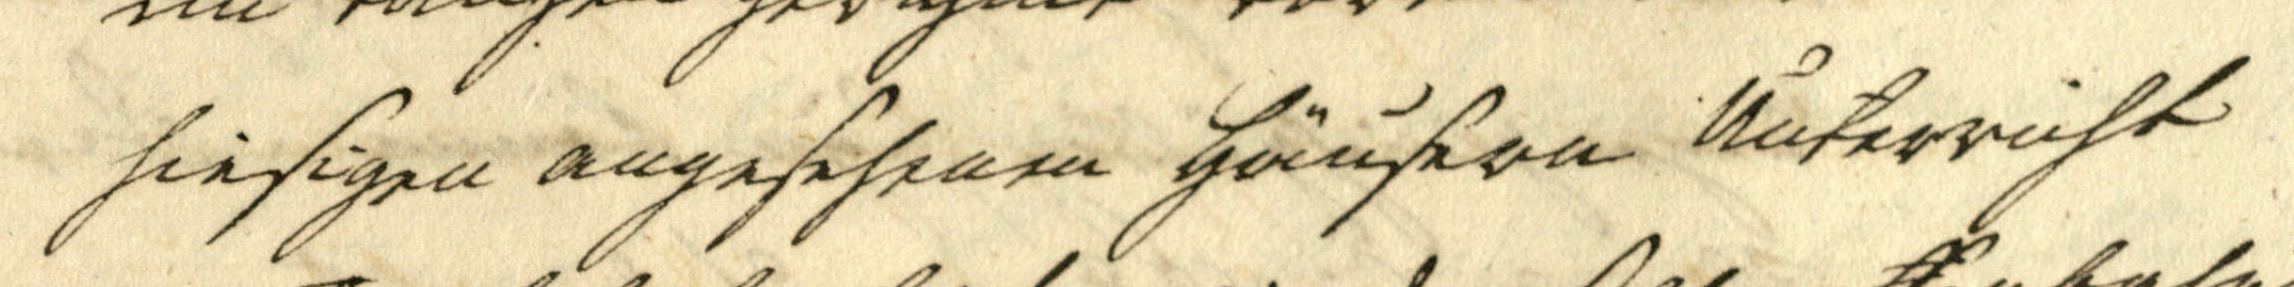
hiesigen angesehenen Häusern Unterricht
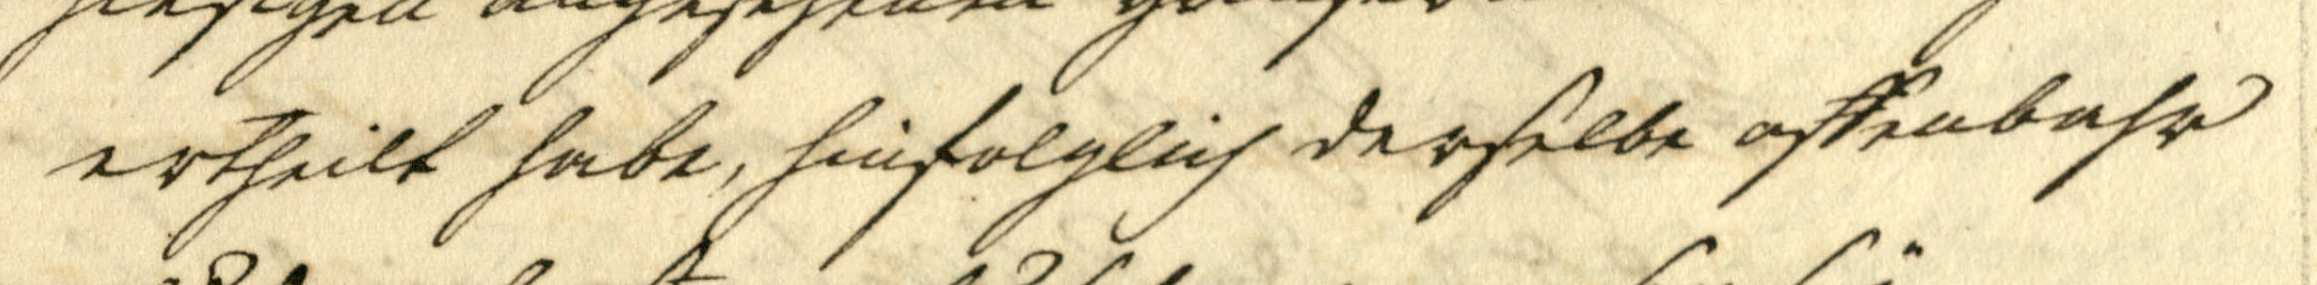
ertheilt habe, hinfolglich derselbe offenbahr
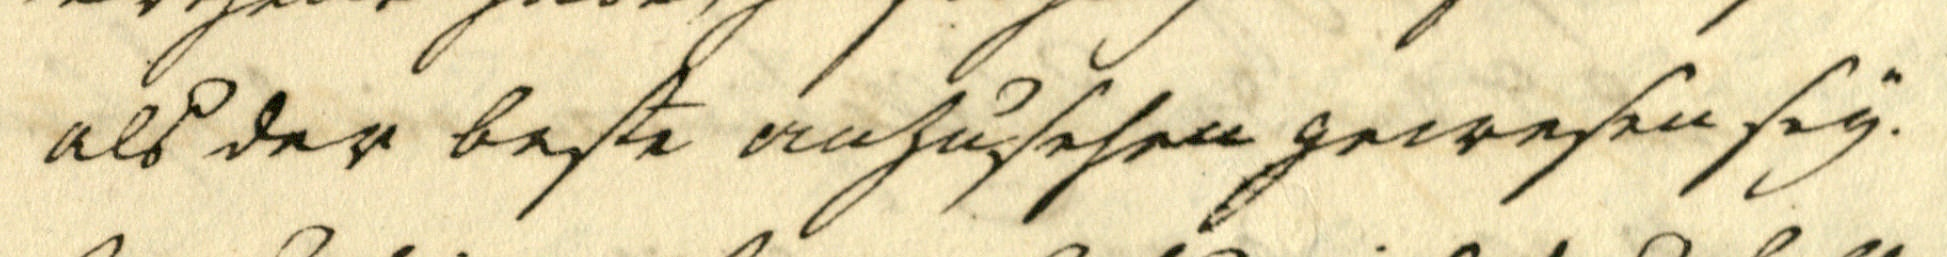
als der beste anzusehen gewesen seÿ.
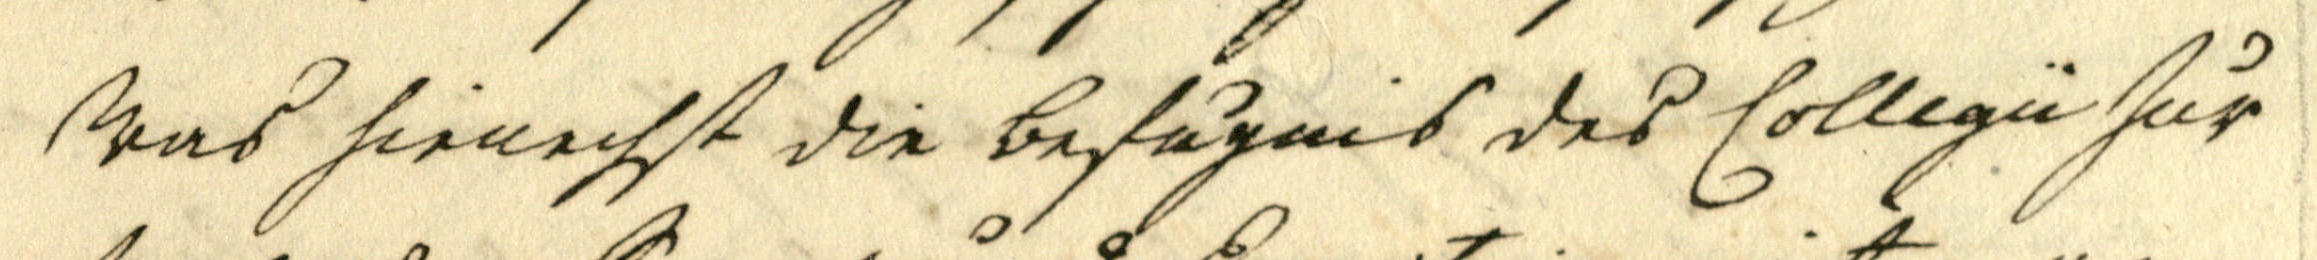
Was hienechst die Befugnis des Collegii zur
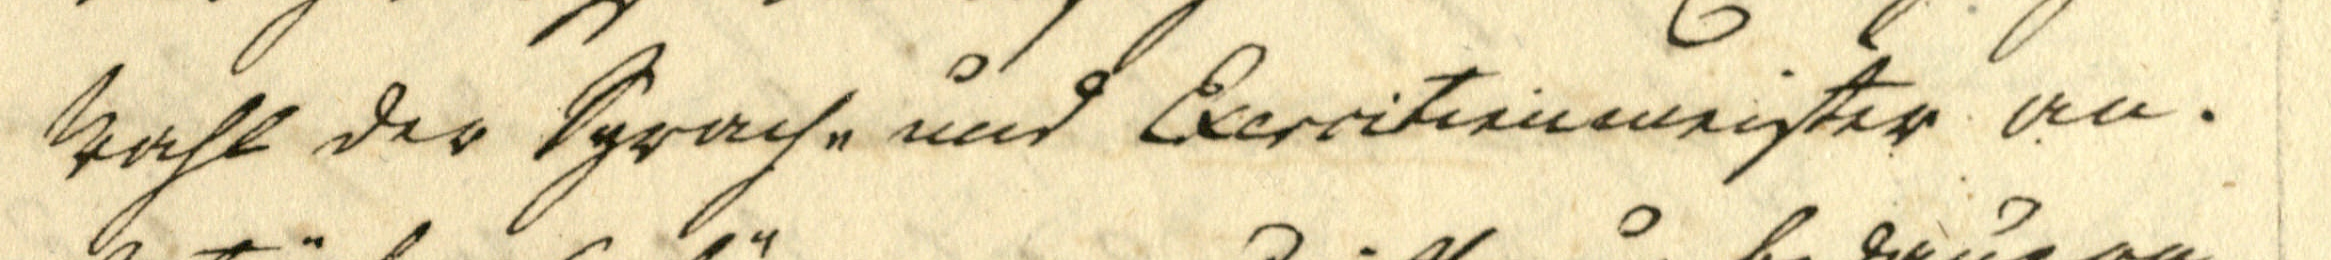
Wahl der Sprach- und Exercitienmeister an¬
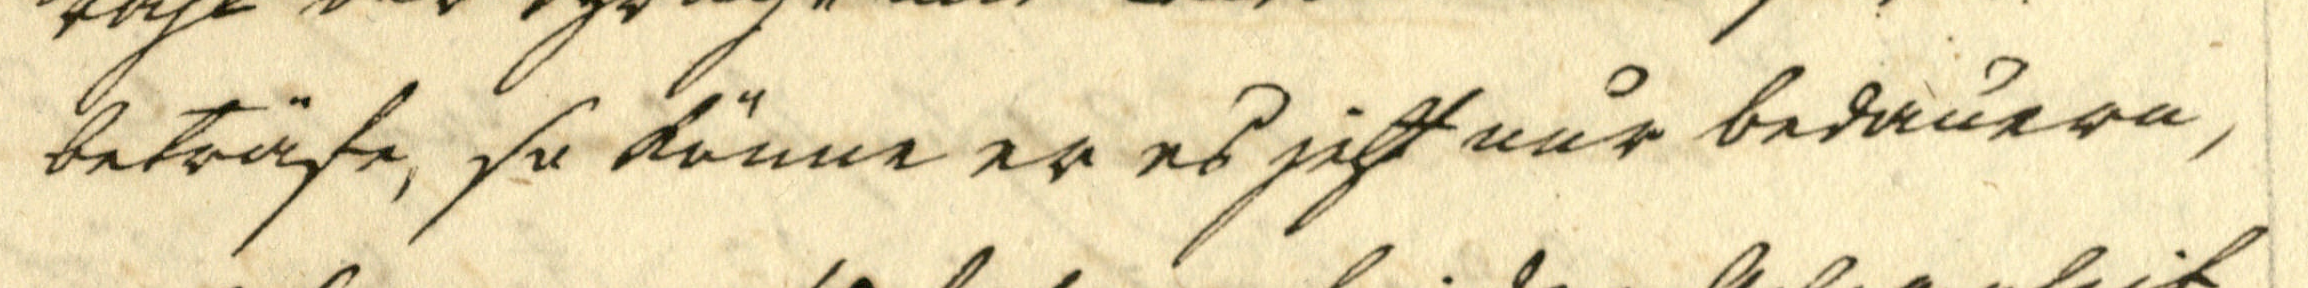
beträfe, so könne er es jetzt nur bedauern,
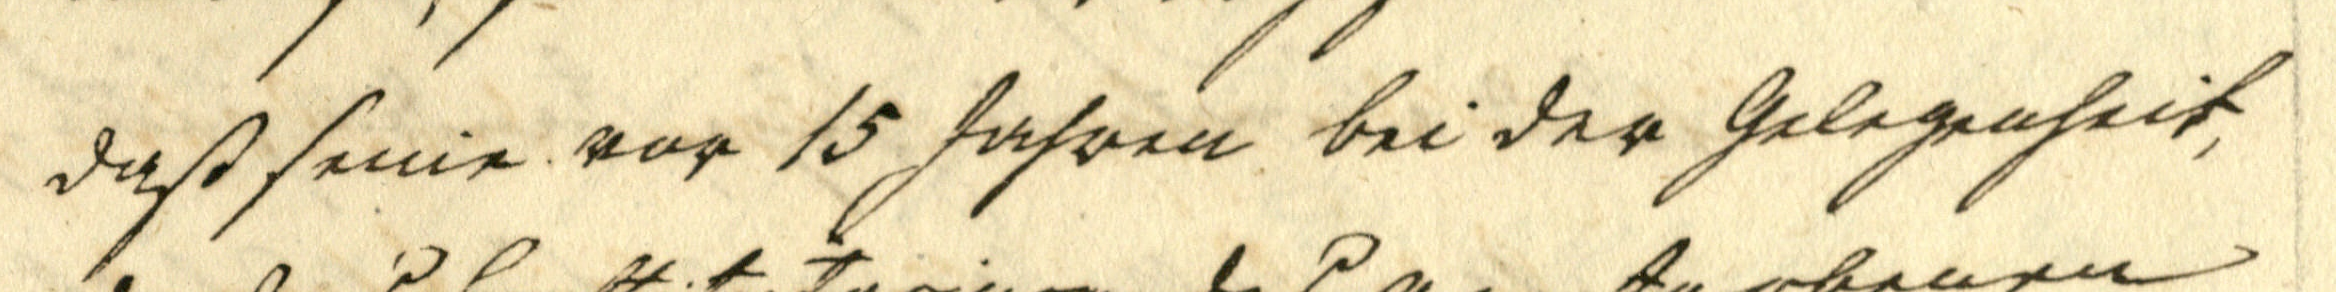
daß seine vor 15 Jahren bei der Gelegenheit,
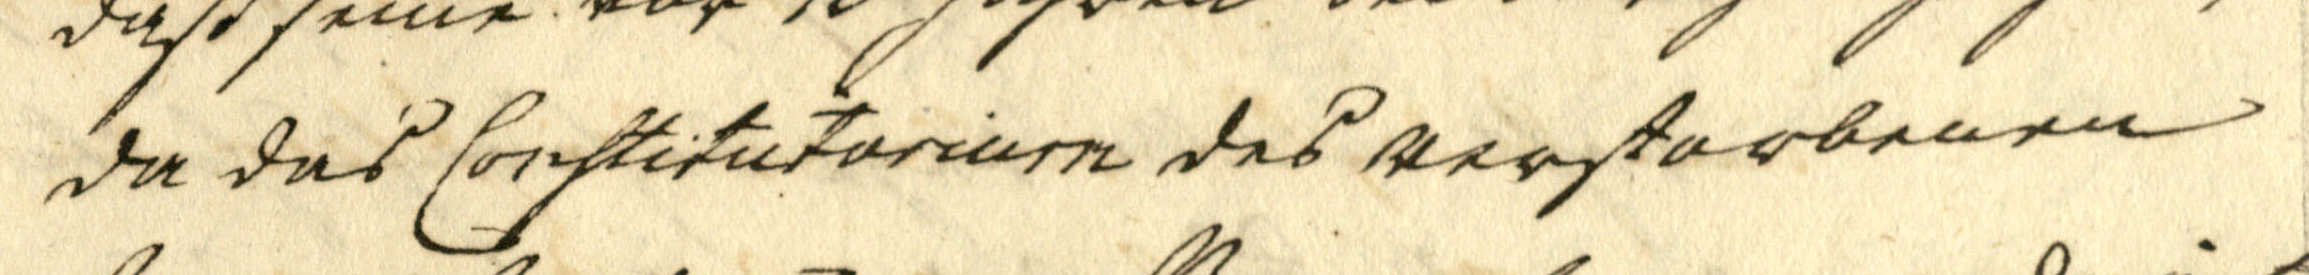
da das Constitutorium des verstorbenen
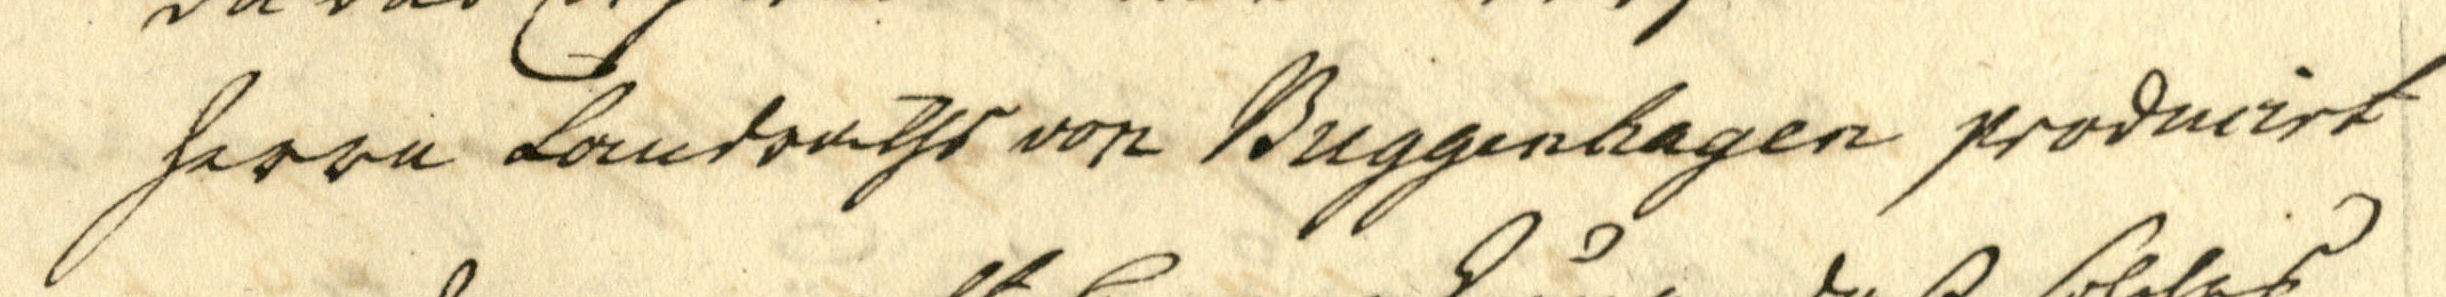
Herrn Landraths von Buggenbagen producirt
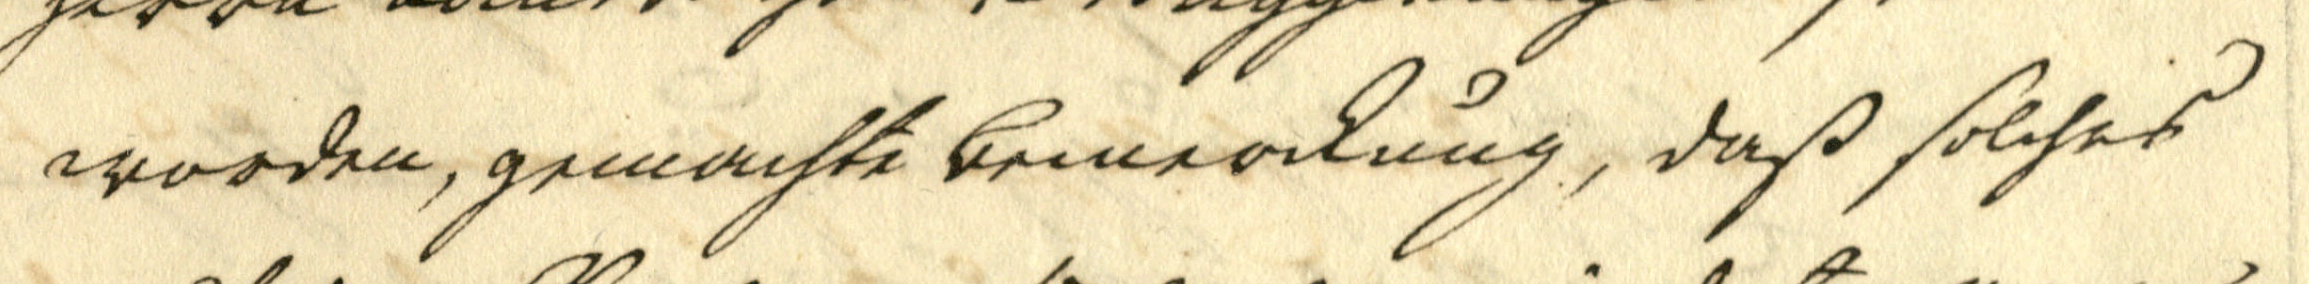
worden, gemachte Bemerckung, daß solches
